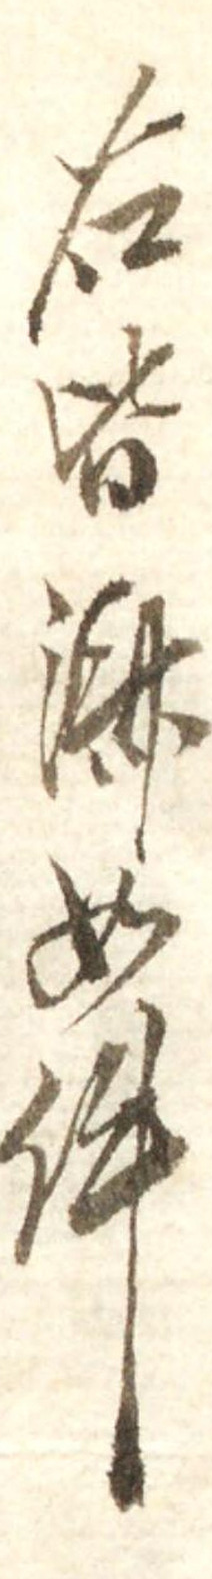右皆済如件
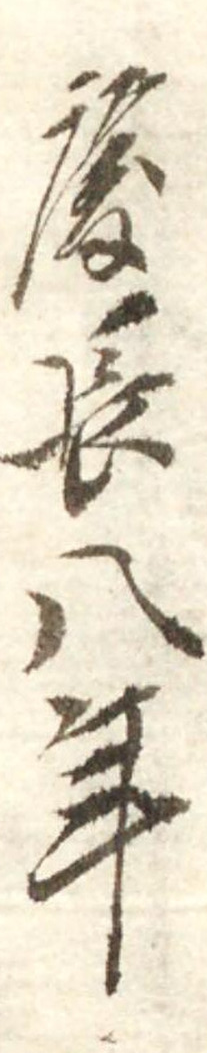慶長八年
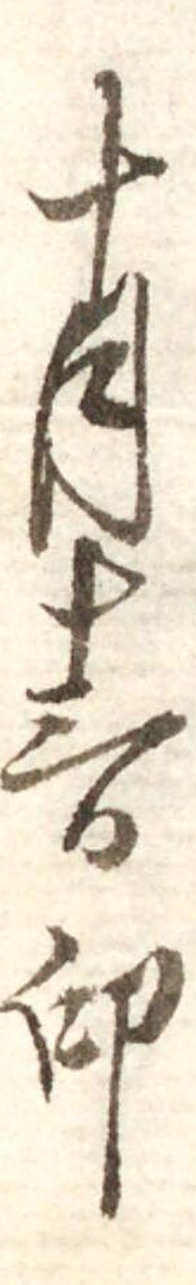十月十三日印
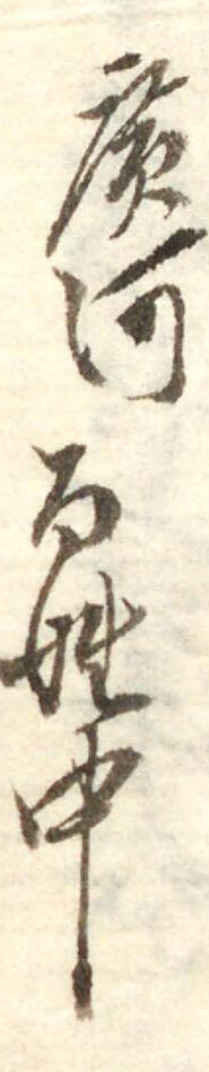廣河百姓中
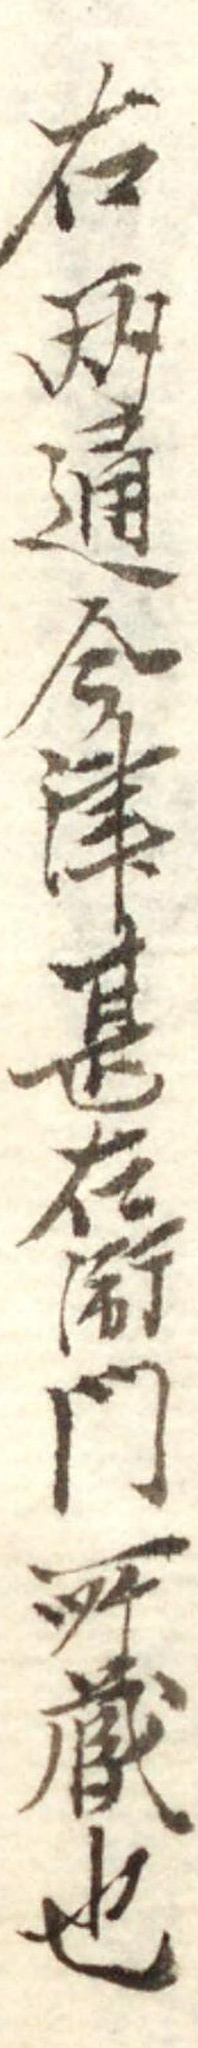右両通今津甚右衛門所蔵也
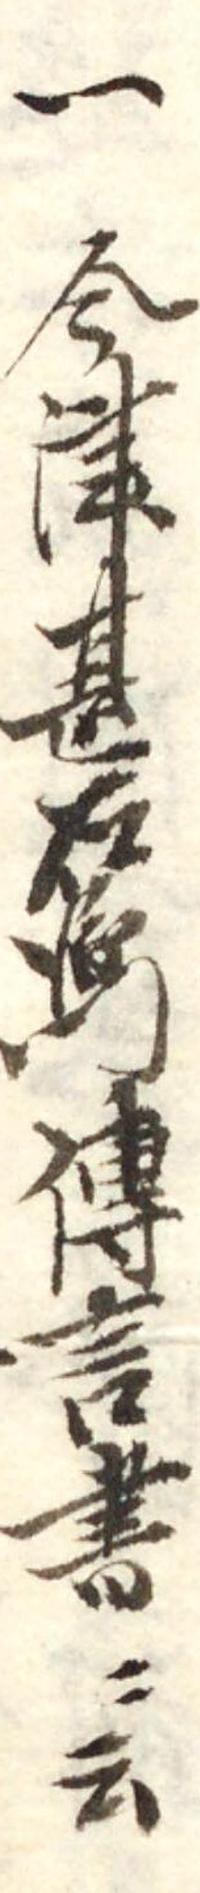一今津甚右衛門伝言書に云
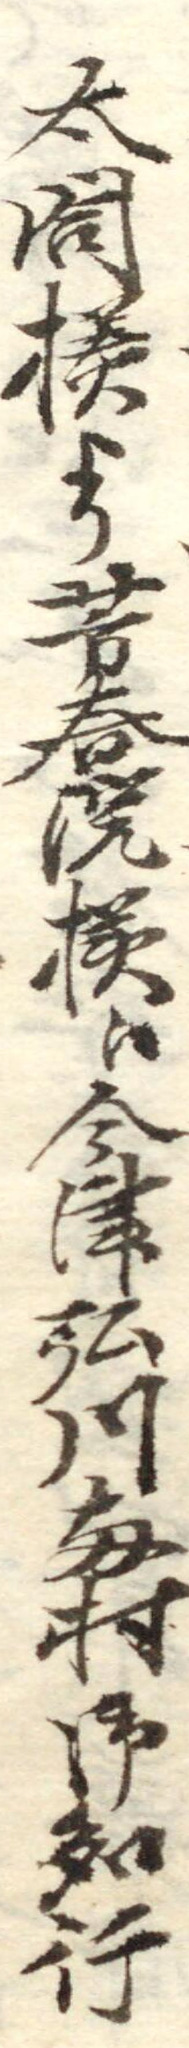太閤様より芳春印様江今津弘川両村御知行
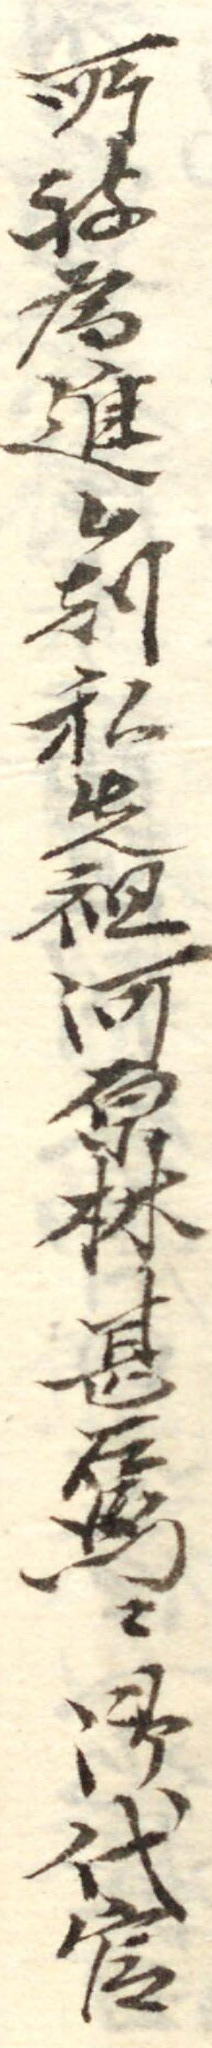所被為進候刻私先祖河原林甚右衛門に御代官
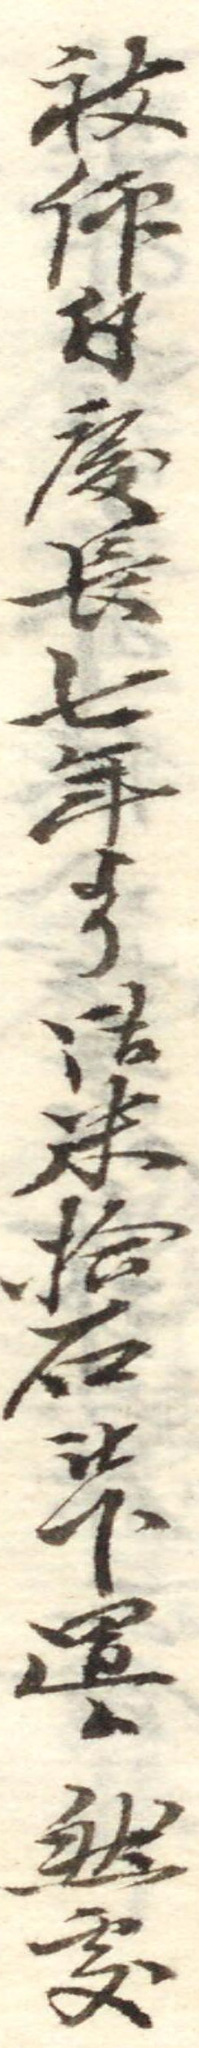被仰付慶長七年より御米拾石被下置候然處
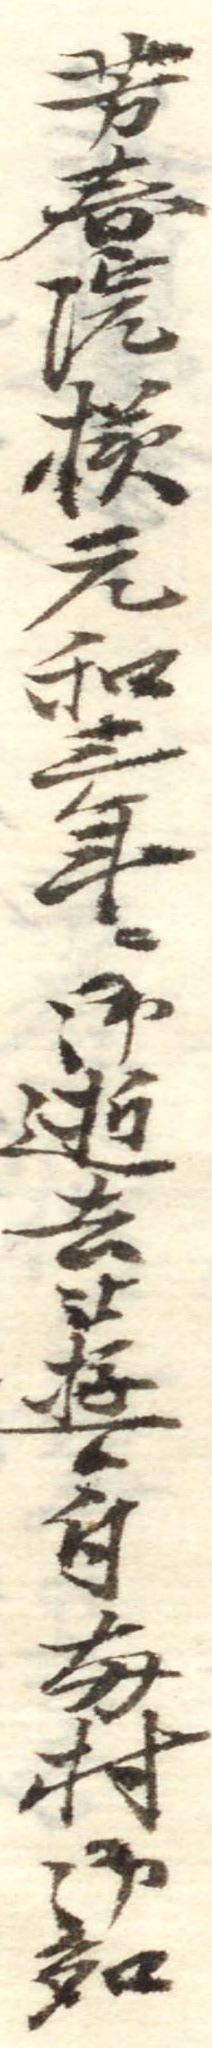芳春院様元和三年に御逝去被遊候付両村御知
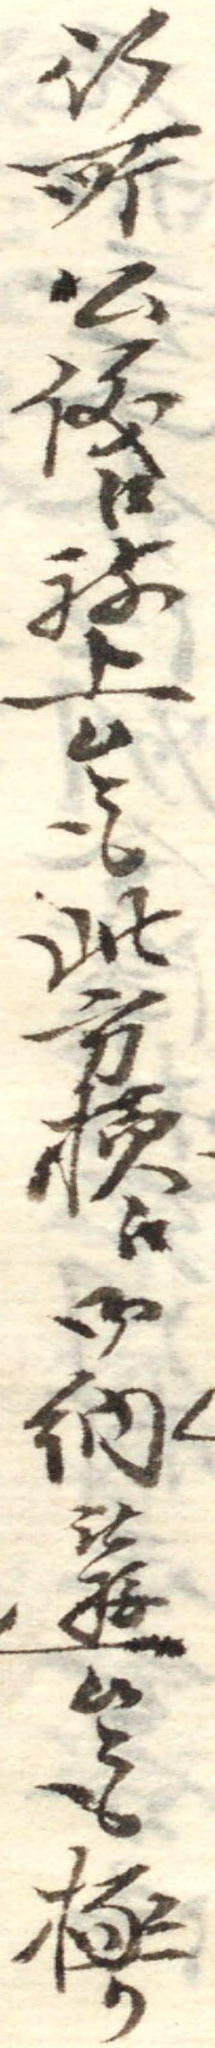行所公儀江被上候とも此方様江御納被遊候とも極り
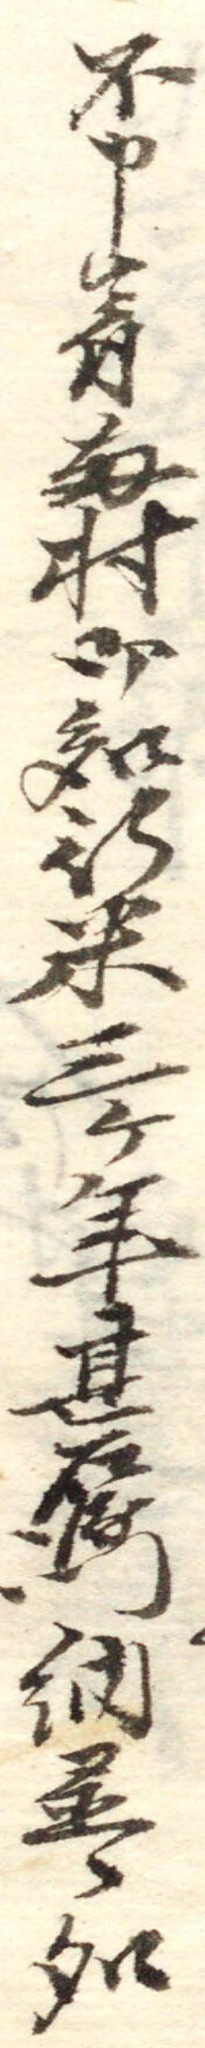不申候に付両村御知行米三け年甚右衛門納置候処
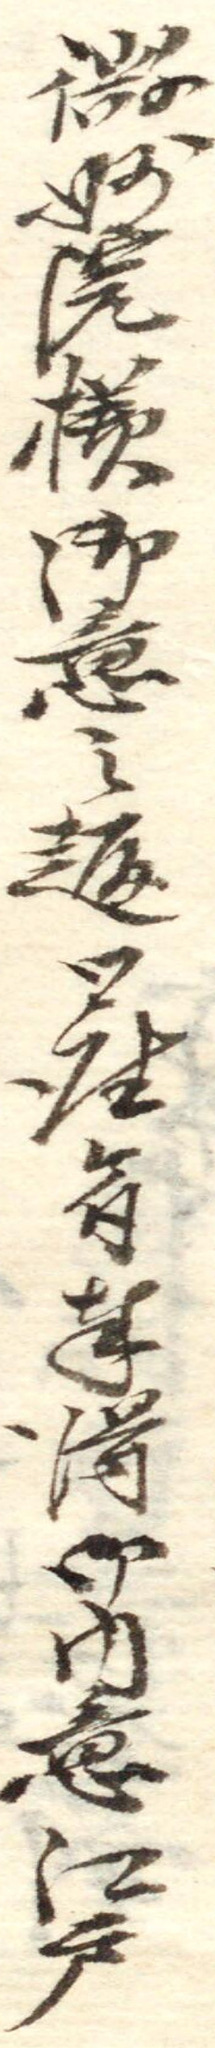徴妙院様御意之趣御座候に付奉得御内意江戸
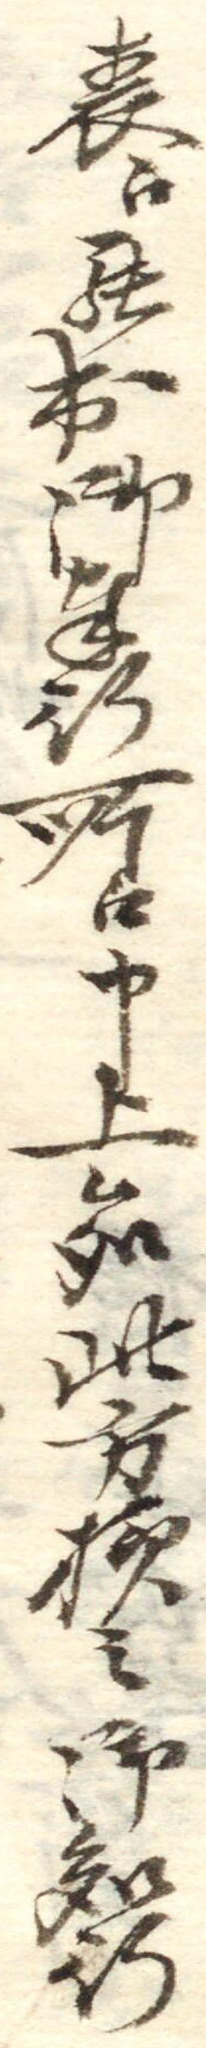表江罷出御奉行所江申上候処此方様之御知行
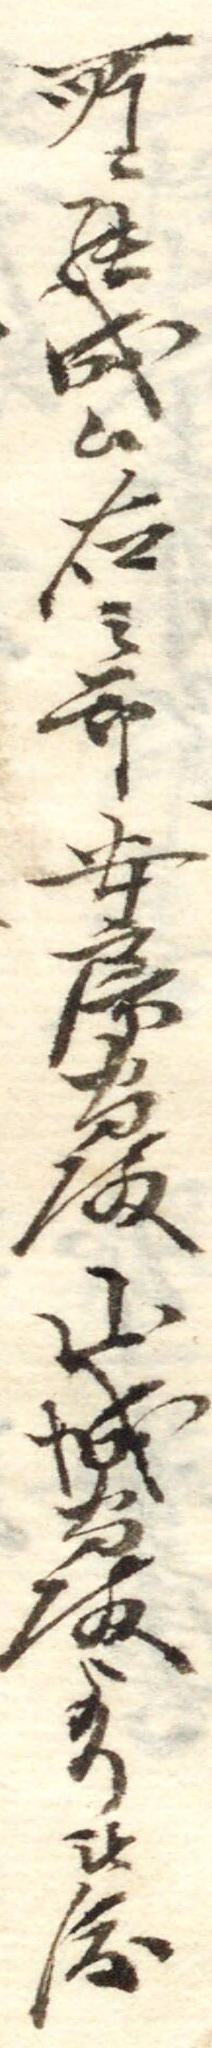所に罷成候右之節安房守殿山城守殿より被渡
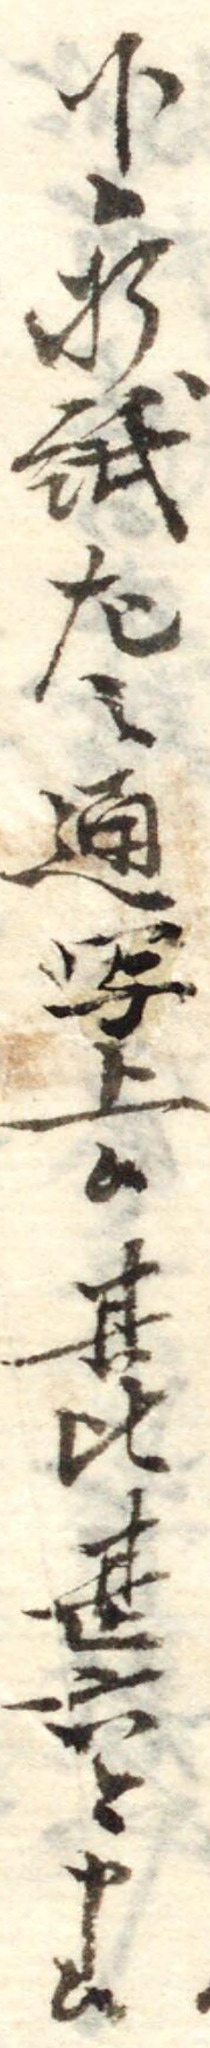下候折紙左之通写上候其比甚六と候
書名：前田家封国証書集録
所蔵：Ishikawa Prefectural Library
